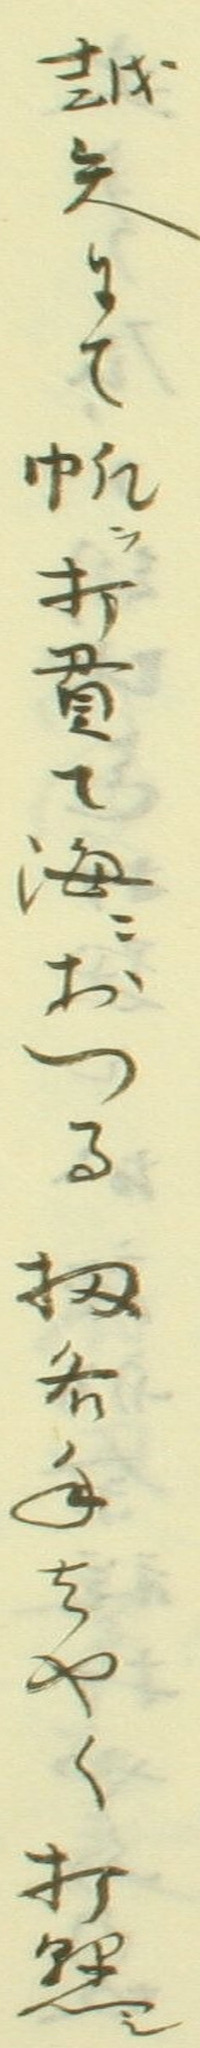越矢にて帆を打貫て海におつる扨各手はやく打懸し
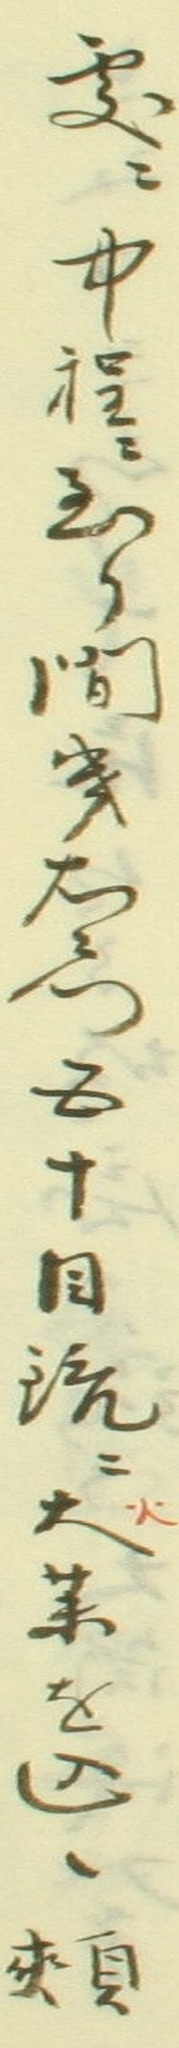處に中程に至り間幾右衛門五十目銃に火薬を込候頬
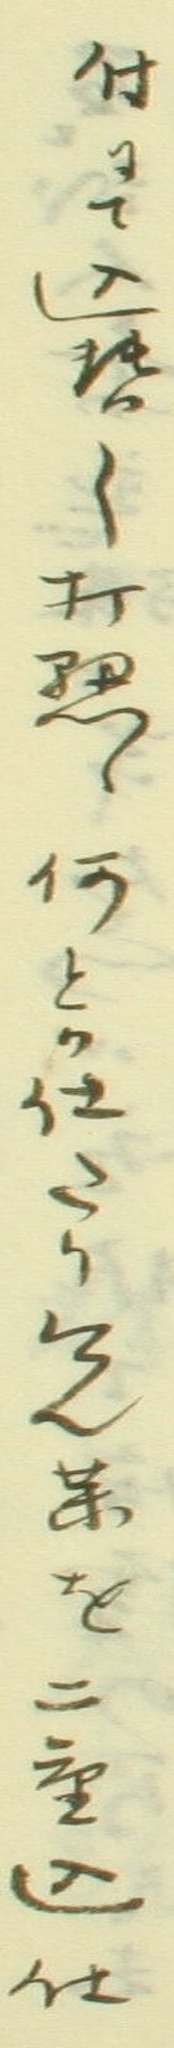付にて込替込替打懸候何とか仕たりけん薬を二重込仕

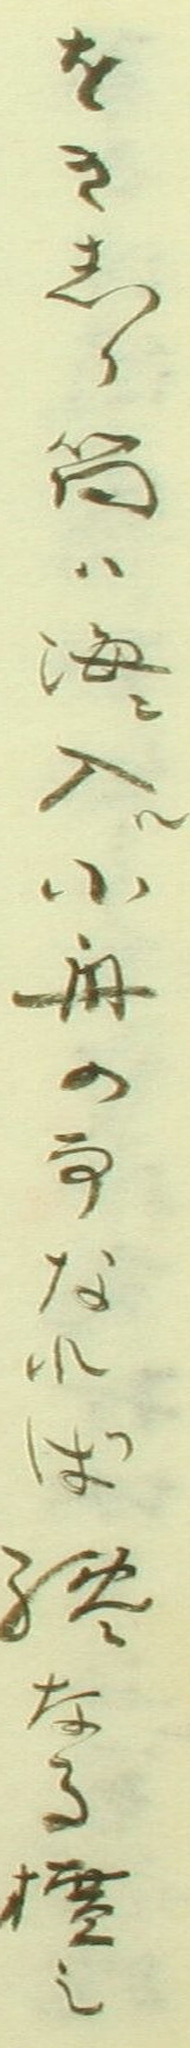をきしり筒は海に入る小舟の事なれば終なる標し
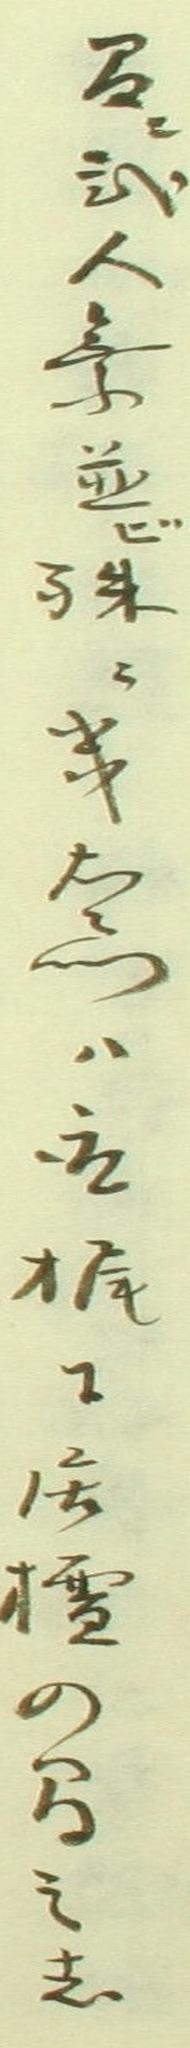間に弐人乗並び殊に幾右衛門は取梶に座標の間之志
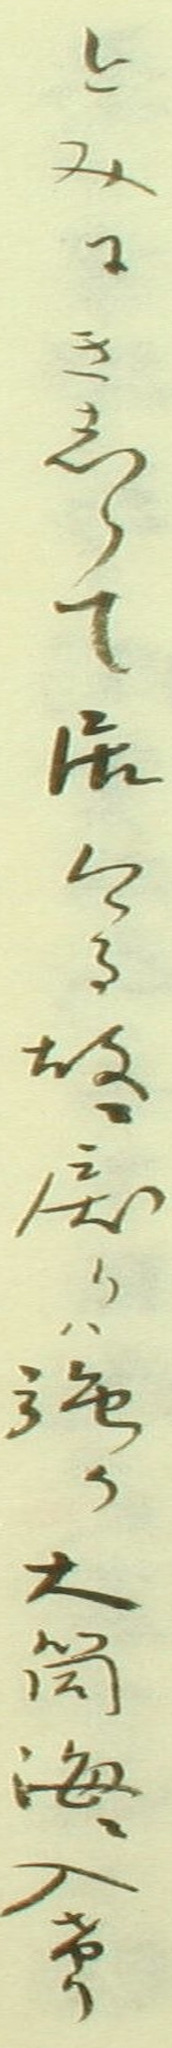とみにきしりて居ける故に戻りは強か大筒海へ入けり
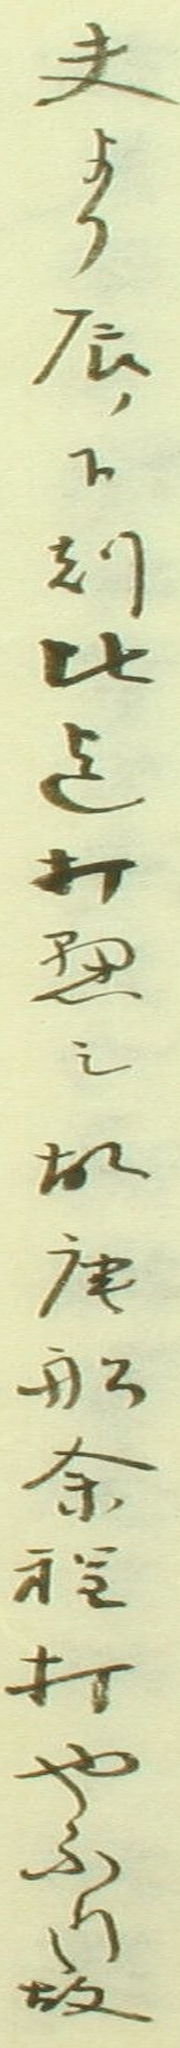夫より辰の下刻此迠打懸し故唐船余程打やふりし故
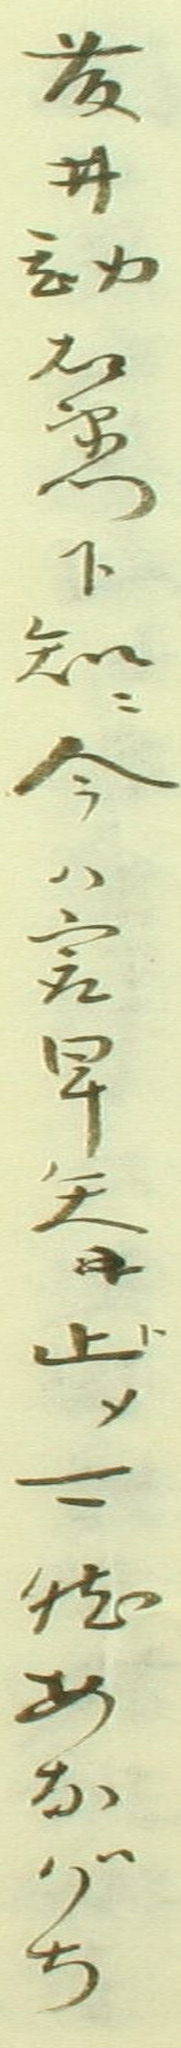藤井勘右衛門下知に今は最早矢を止め可然あながち
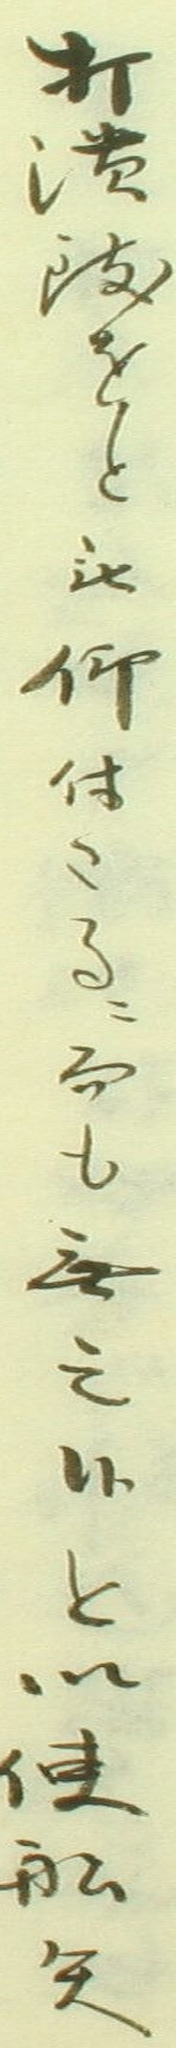打潰致をと被仰せ付たるに而も無之候と以使船矢
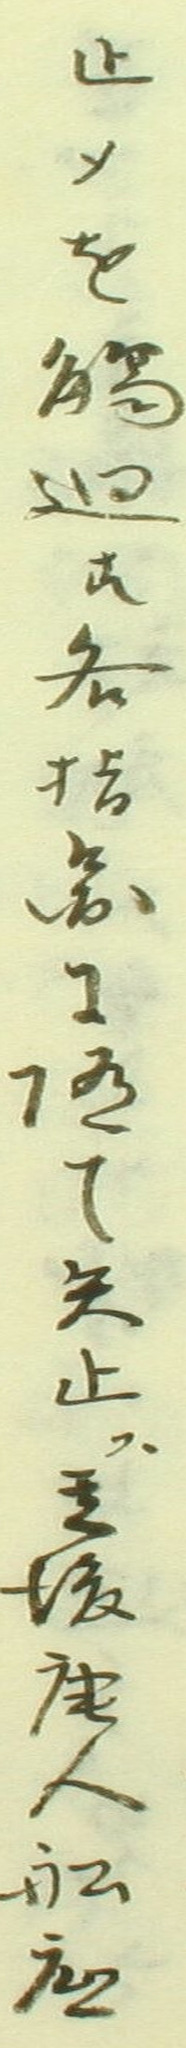止めを触廻は各指図に随て矢止す其後唐人船底
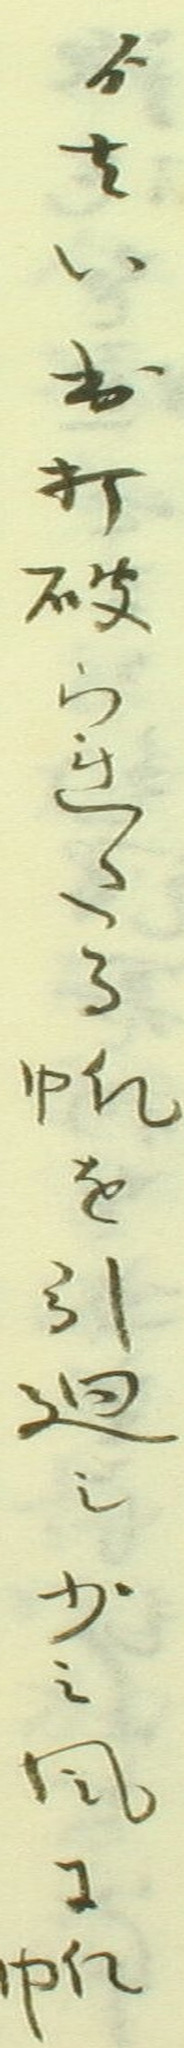ゟはい出打破られたる帆を引廻し少之風に帆
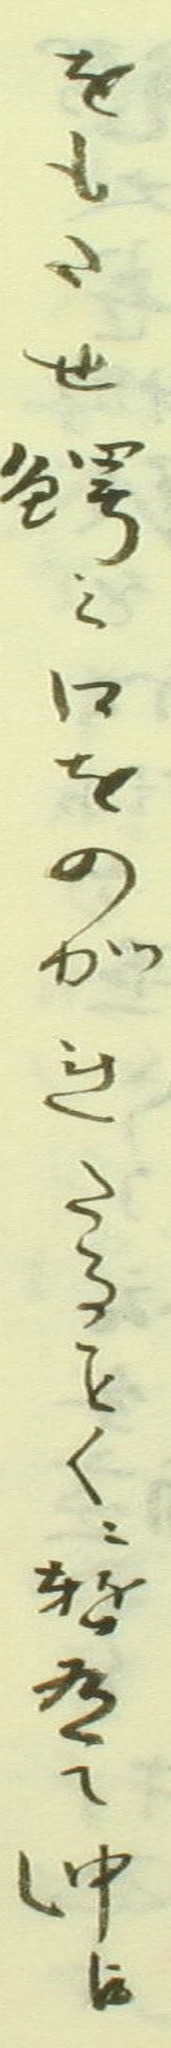をもたせ鰐之口をのがれたることくに暫有て沖迠
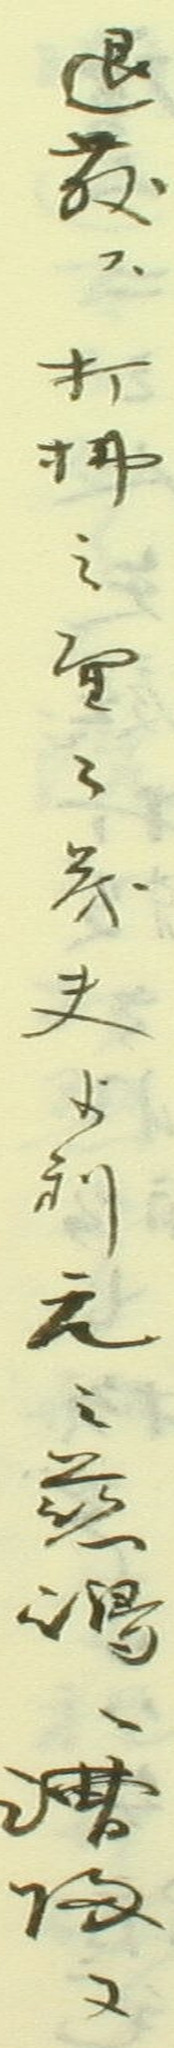退處す打払之面々も夫より元之慈嶋へ漕帰る
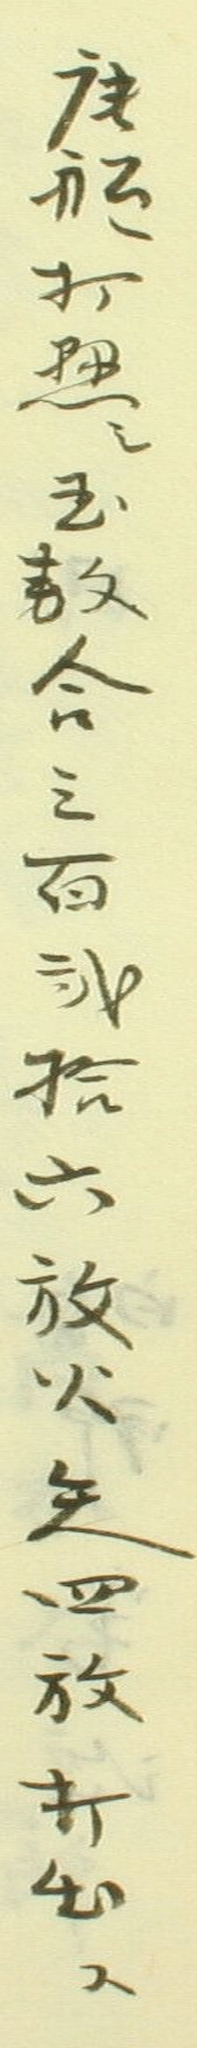唐船へ打懸し球数合三百弐拾六放火矢四放打出す
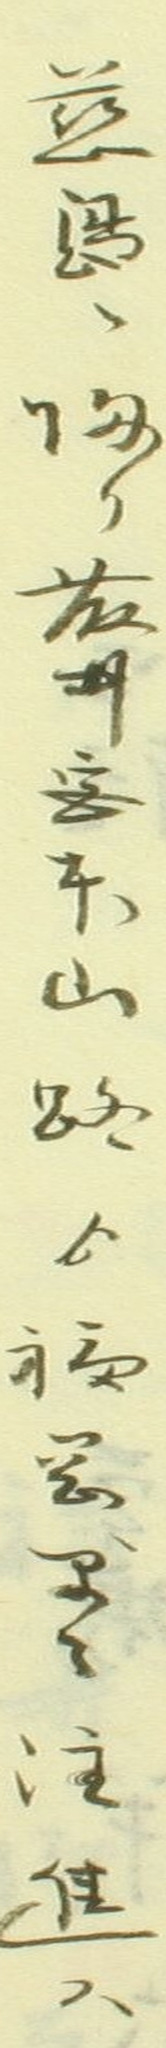慈島へ帰り藤井宮本山路ゟ福岡へ里里注進す
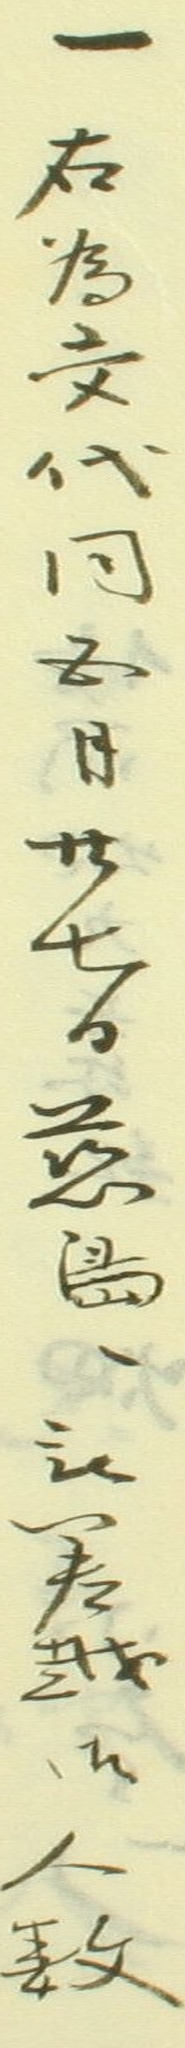一右為交代同五月廿七日慈島へ被差越御人数
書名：唐船漂流記 三
